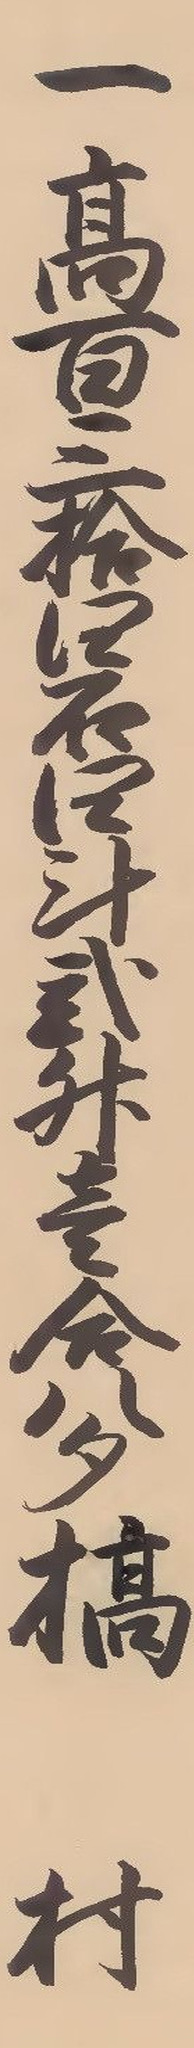一高百三拾四石四斗弐升壱合八勺槁村
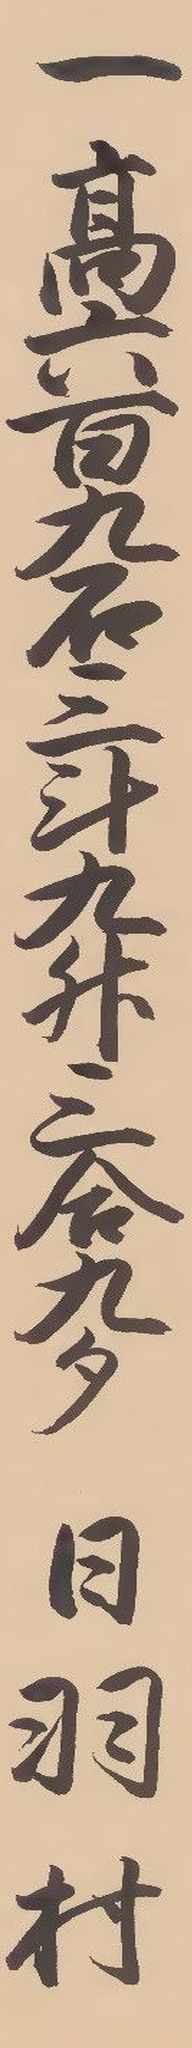一高六百九石三斗九升三合九勺日羽村
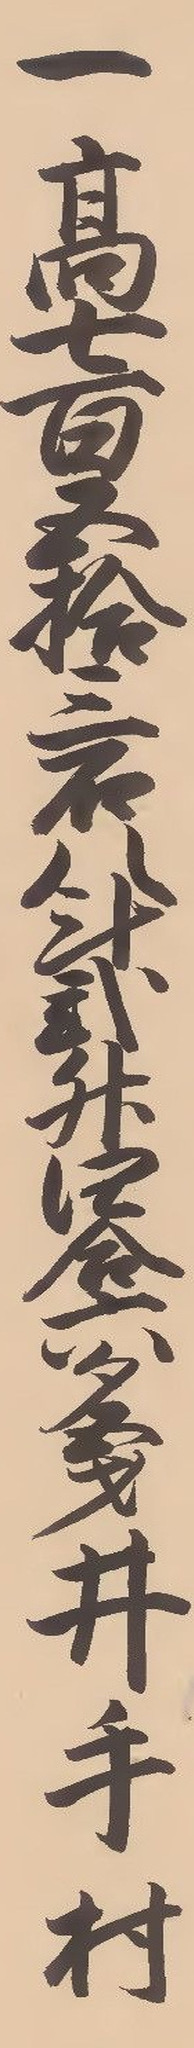一高七百五拾三石八斗弐升四合六勺五才井手村
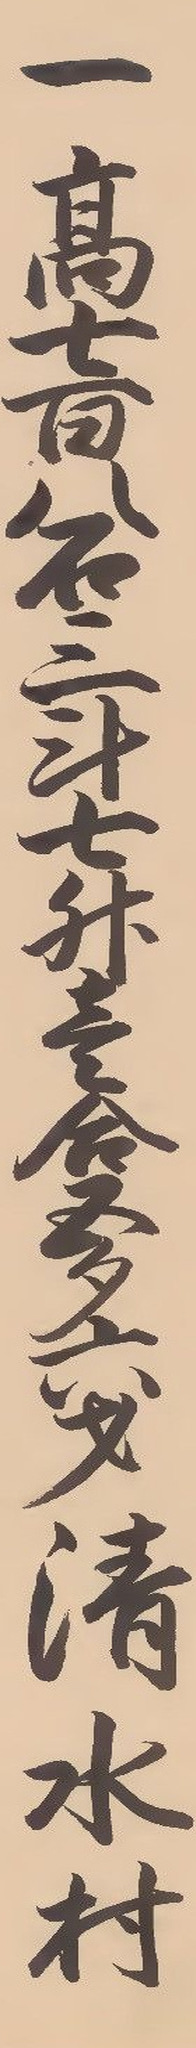一高七百八石三斗七升壱合五勺六才清水村
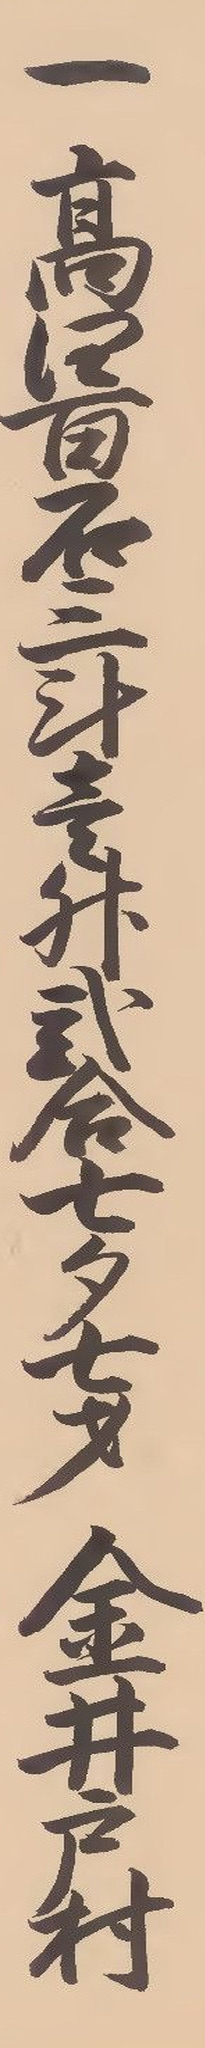一高四百石三斗壱升弐合七勺七才金井戸村
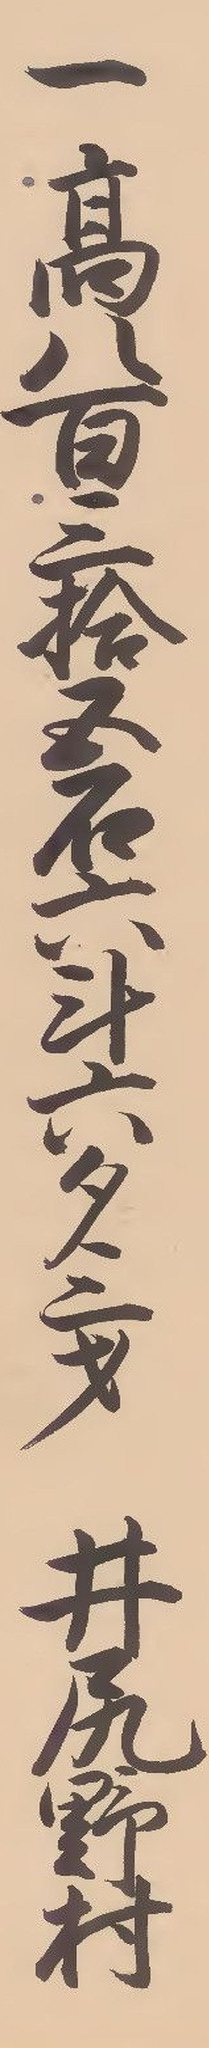一高八百三拾五石六斗六勺三才井尻野村

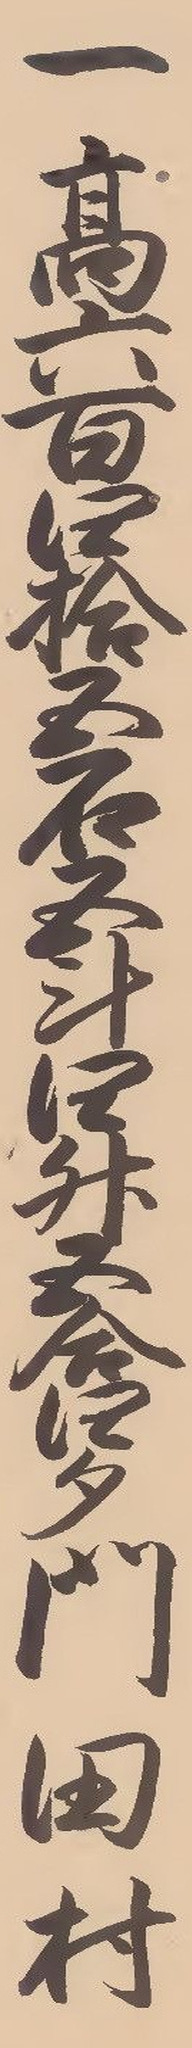一高六百四拾五石五斗四升五合四勺門田村
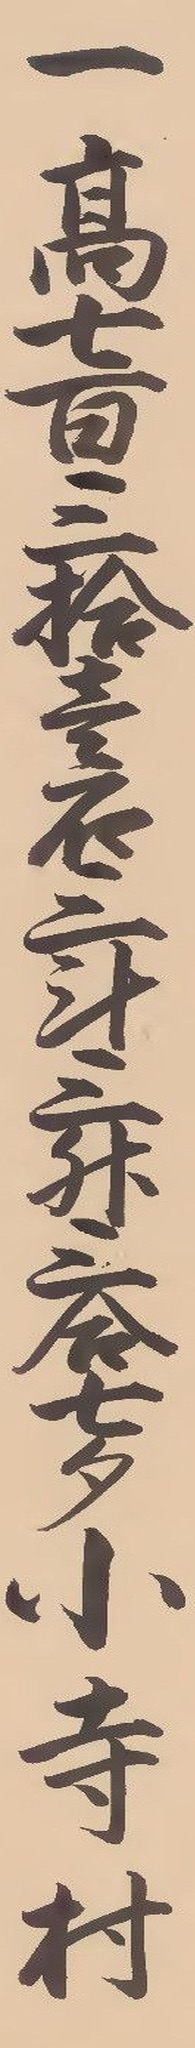一高七百三拾壱石三斗三升三合七勺小寺村
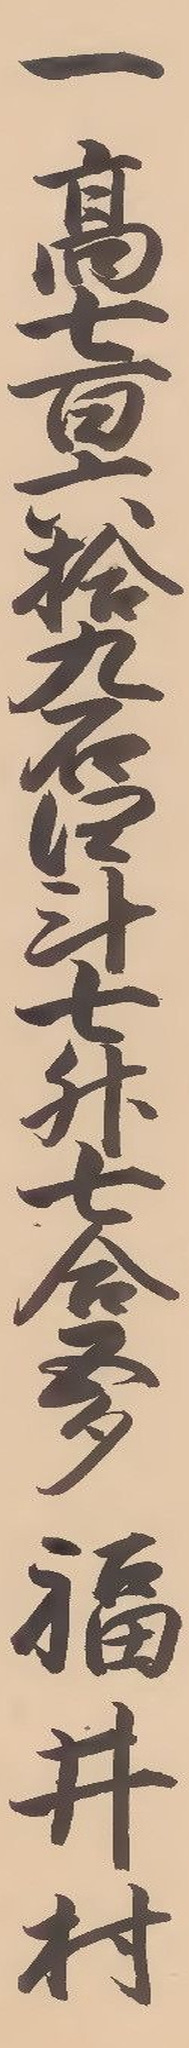一高七百六拾九石四斗七升七合五勺福井村
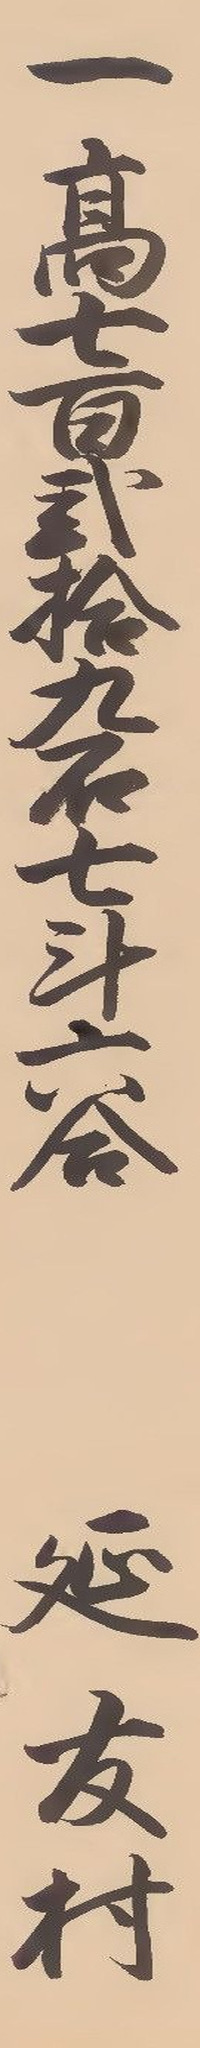一高七百弐拾九石七斗六合延友村
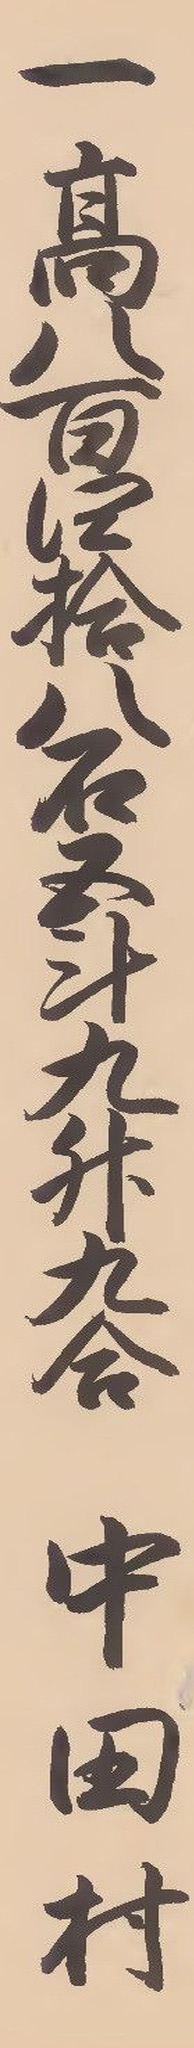一高八百四拾八石五斗九升九合中田村
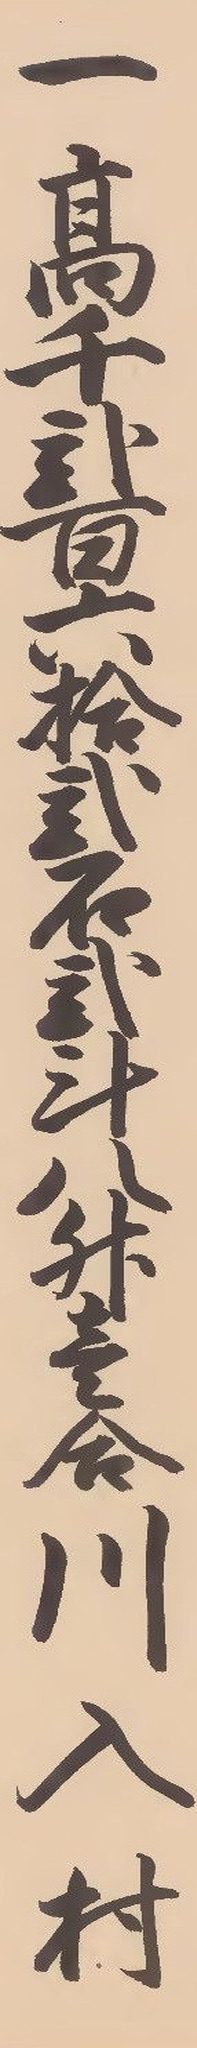一高千弐百六拾弐石弐斗八升壱合川入村
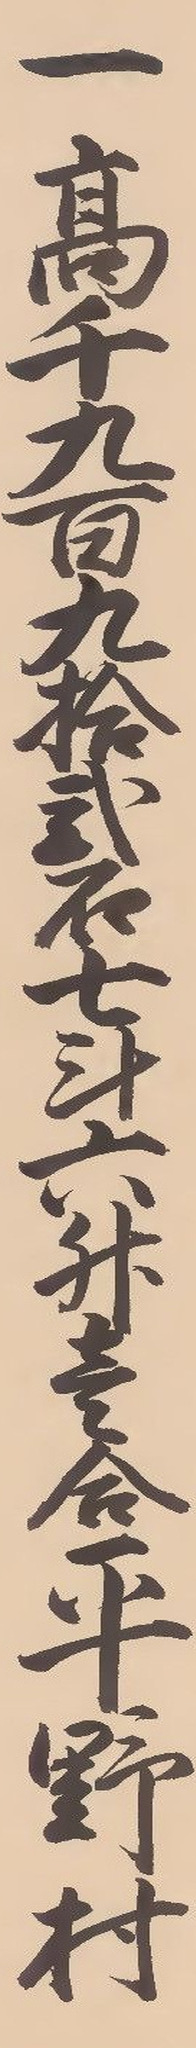一高千九百九拾弐石七斗六升壱合平野村
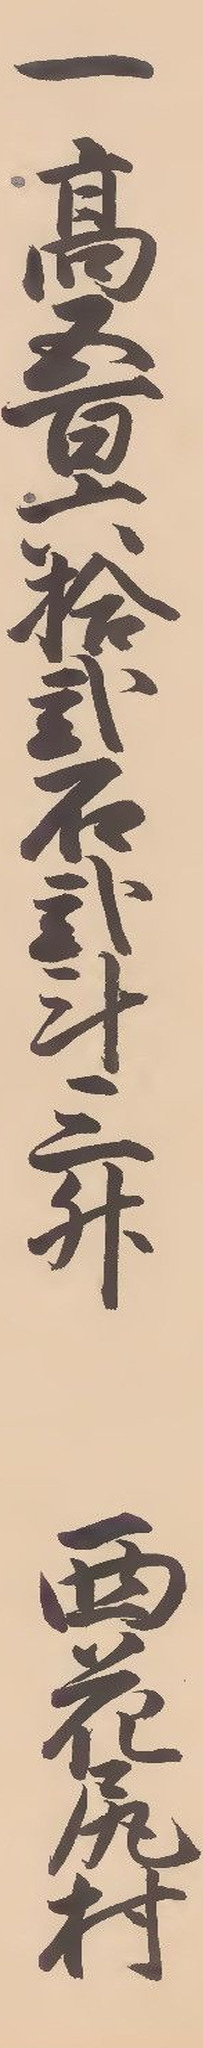一高五百六拾弐石弐斗三升西花尻村

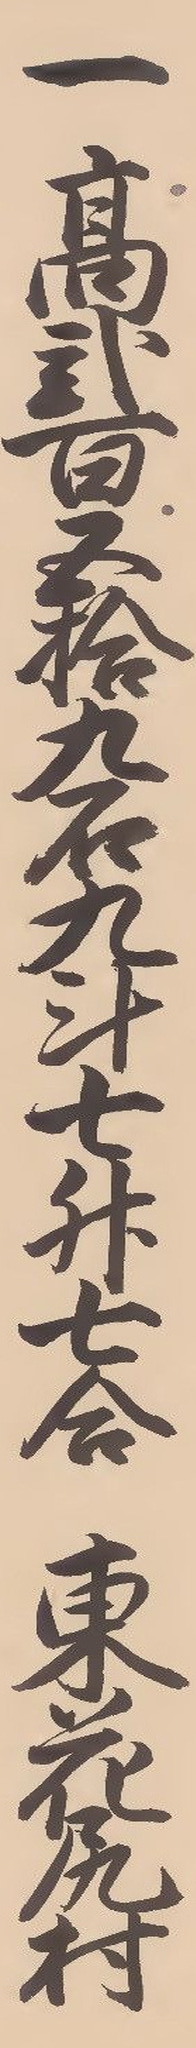一高弐百五拾九石九斗七升七合東花尻村
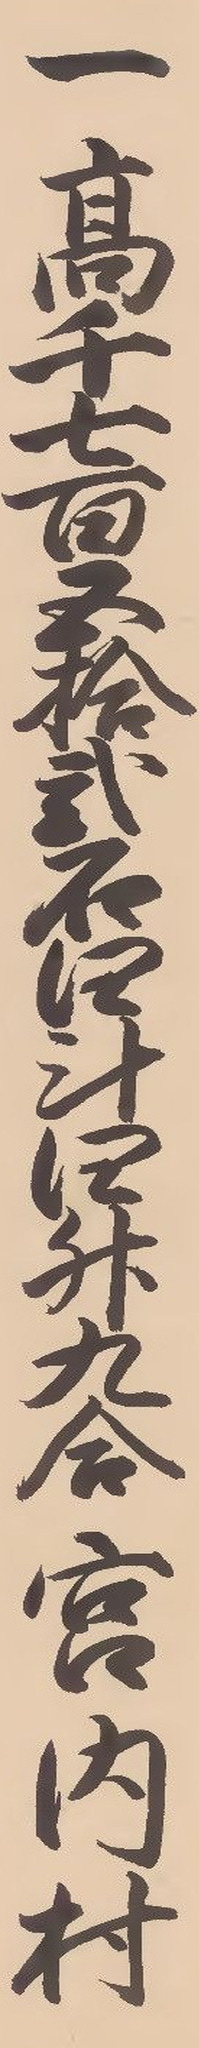一高千七百五拾弐石四斗四升九合宮内村
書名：備中国郷帳
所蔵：国立公文書館 National Archives of Japan
